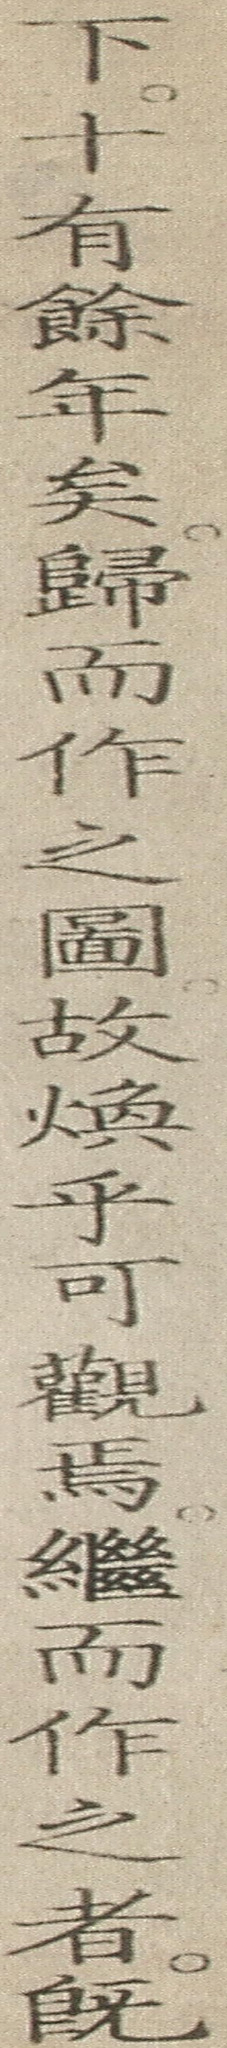下。十有余矣。帰而作之図。故煥乎可観焉。継而作之者。既
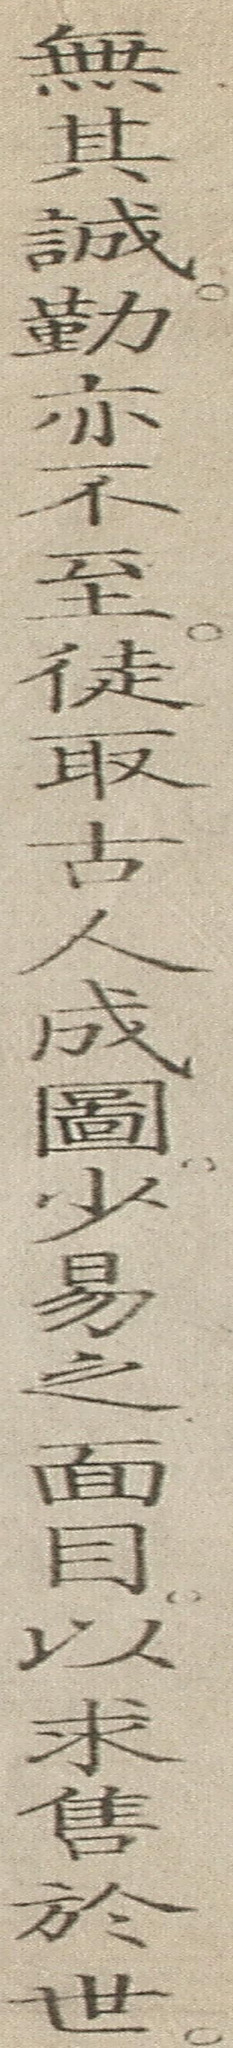無其誠。勤亦不至。徒取古人成図。少易之面目以。来售於世。
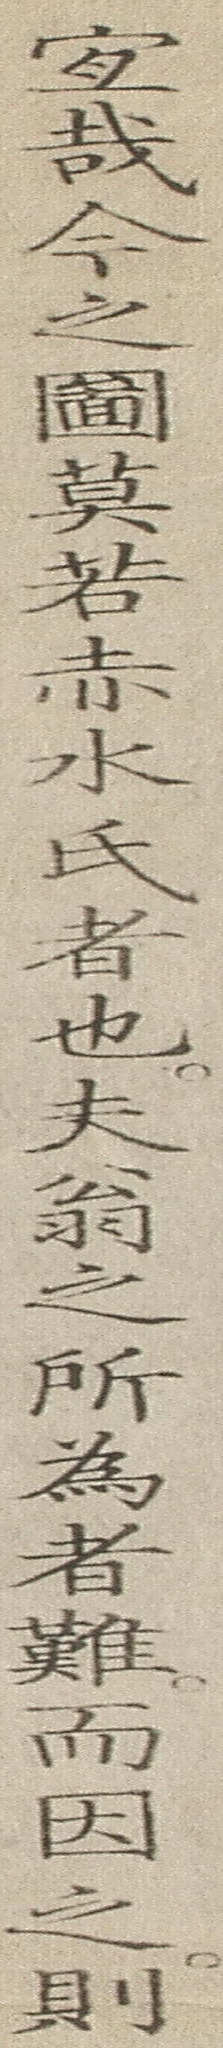宐哉今之図莫若赤水氏者也。夫翁之所為者難。而因之。則
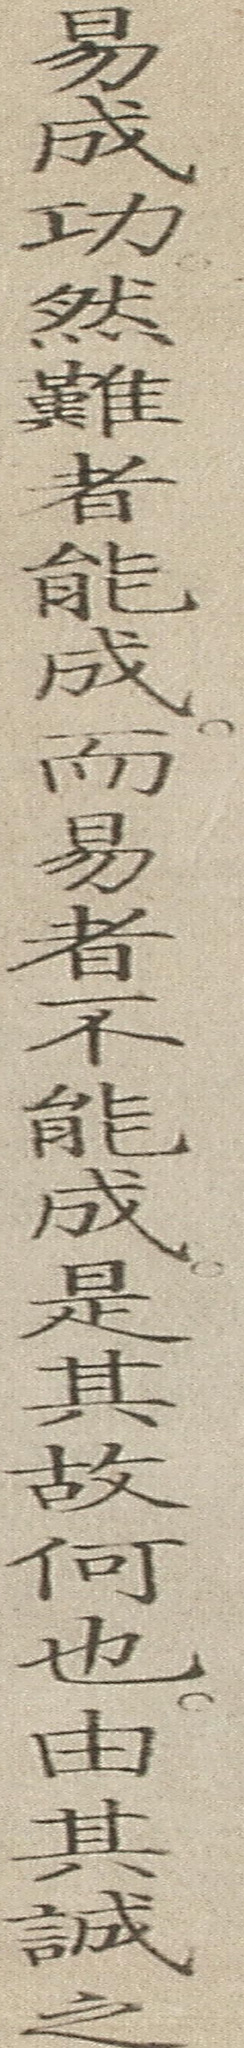易成功然難者能成。而易者不能成是故何也。由其誠之
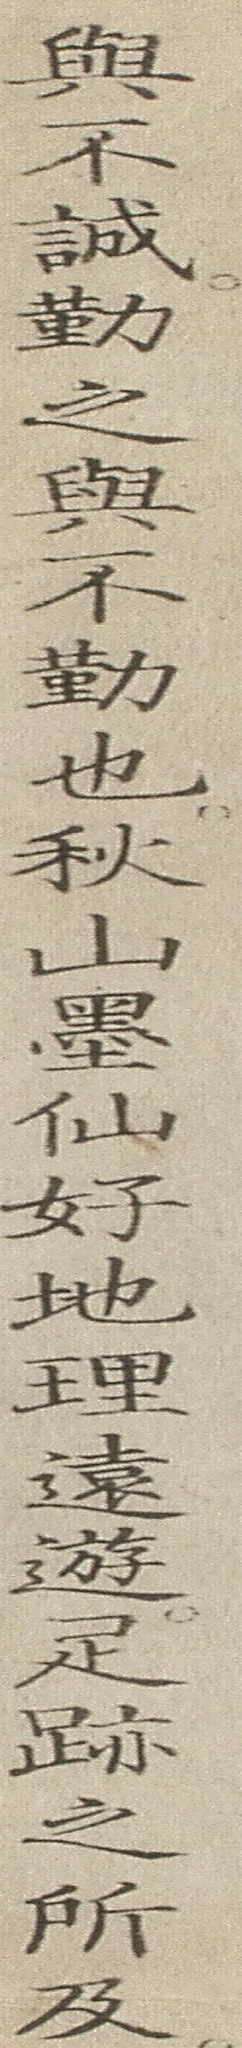與不誠。勤之與不勤也。秋山墨仙好地理遠遊。足跡之所及。
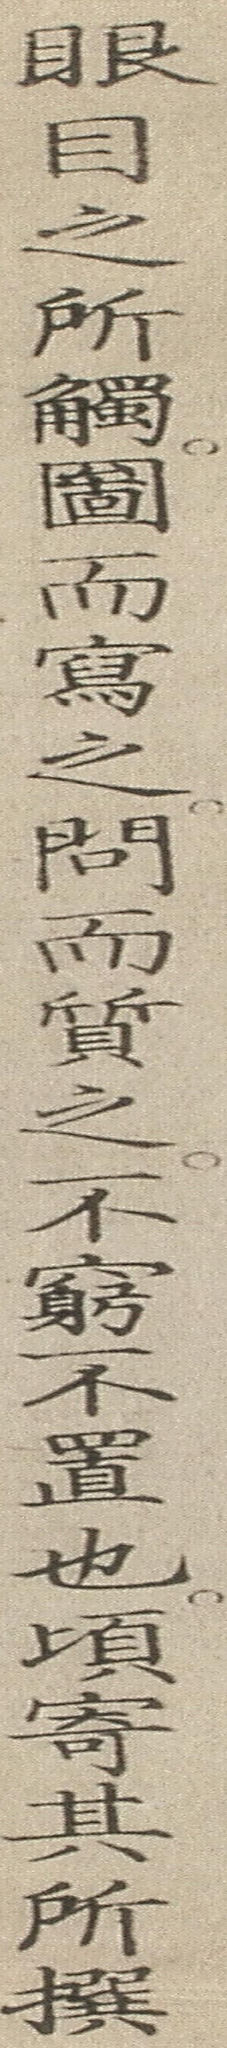眼目之所触。図而写之。問而質之。不窮不置也。頃寄其所撰
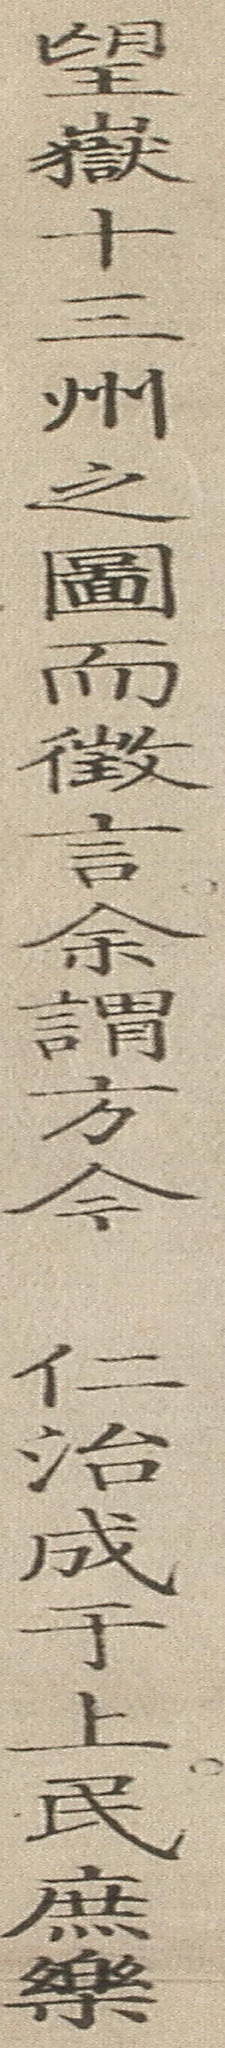望嶽十三州之図而徴言余謂方今仁治成于上民庶楽
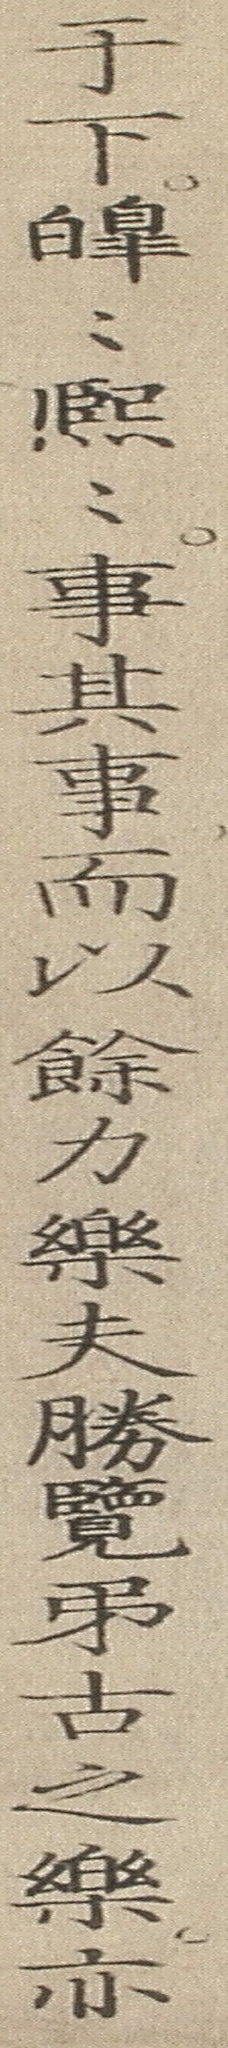于下。暤〻煕〻。事其事而以余力楽勝宝𢎨古之楽。亦
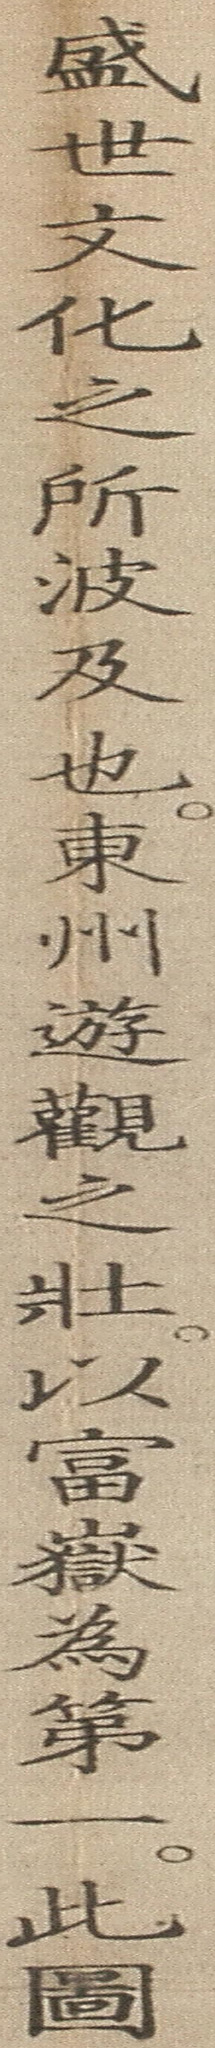盛世文化之所波及也。東州遊観之壯。以富嶽為第一。此図
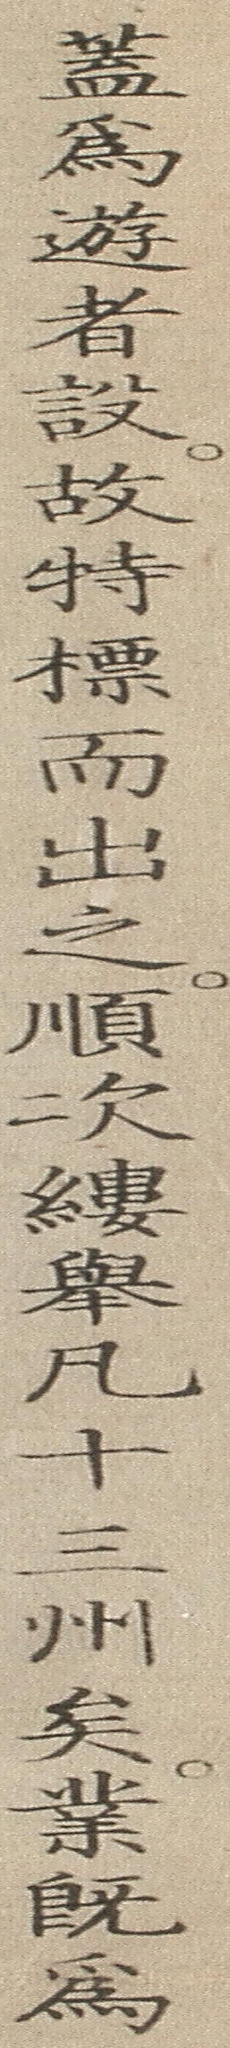蓋為遊者設。故特標而出之。順次縷挙凡十三州矣。業既為
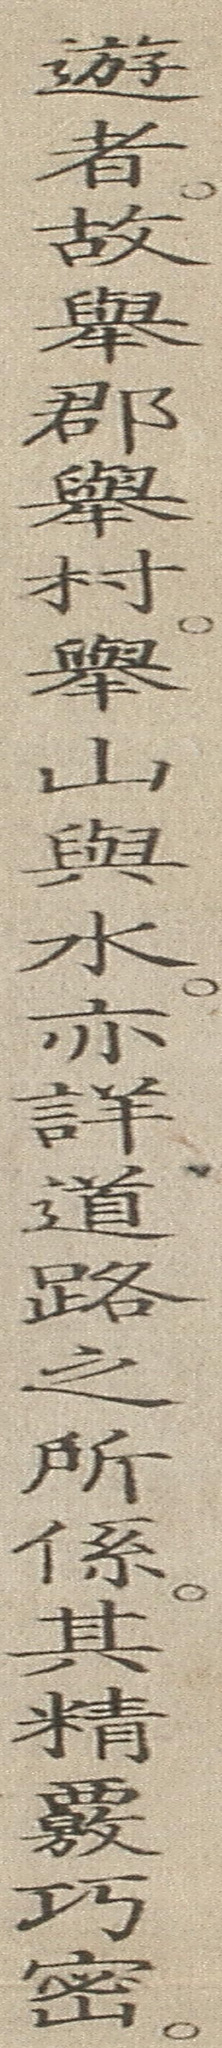遊者。故挙郡挙村。挙山挙水。亦詳道路之所係。其精覈巧密。
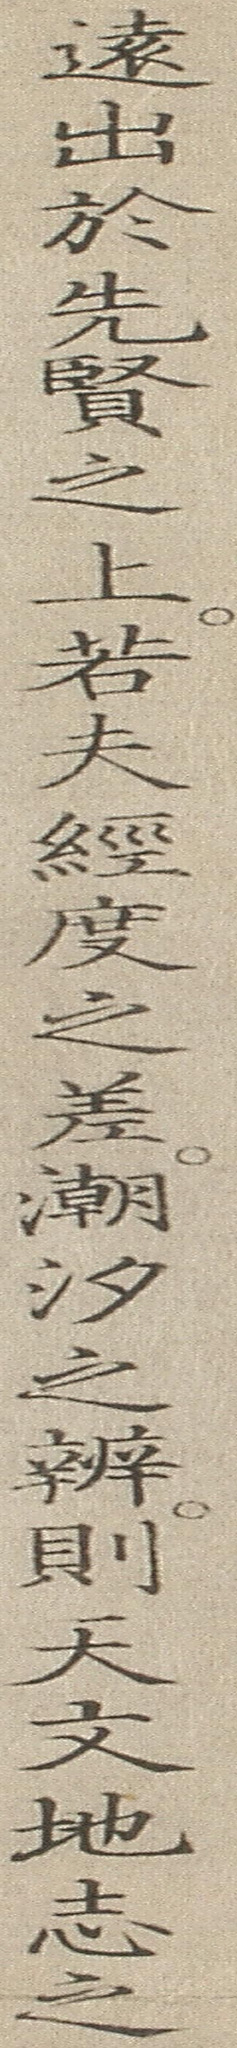遠出於先賢之上。若夫経度之差。潮汐之弁。則天文地志之
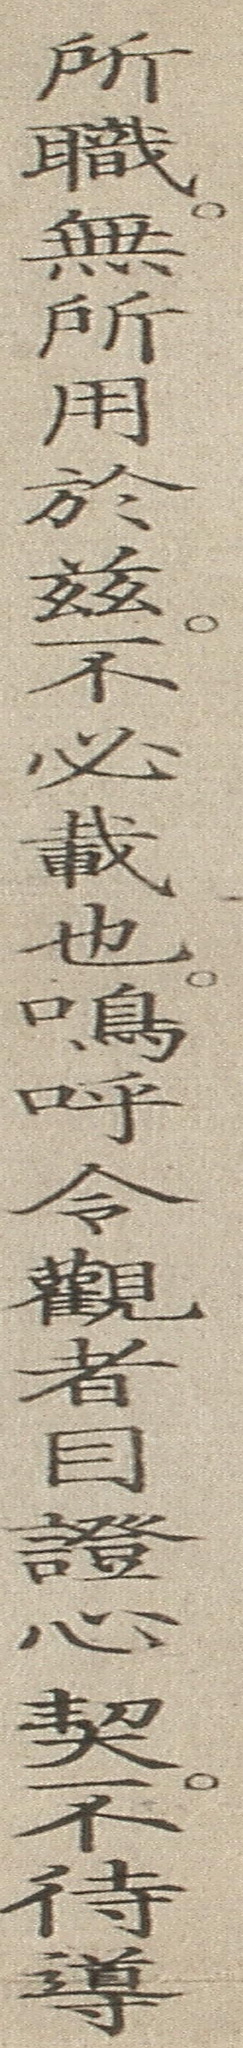所職。無所用於茲。不必載也。嗚呼令観者目証心契。不待導
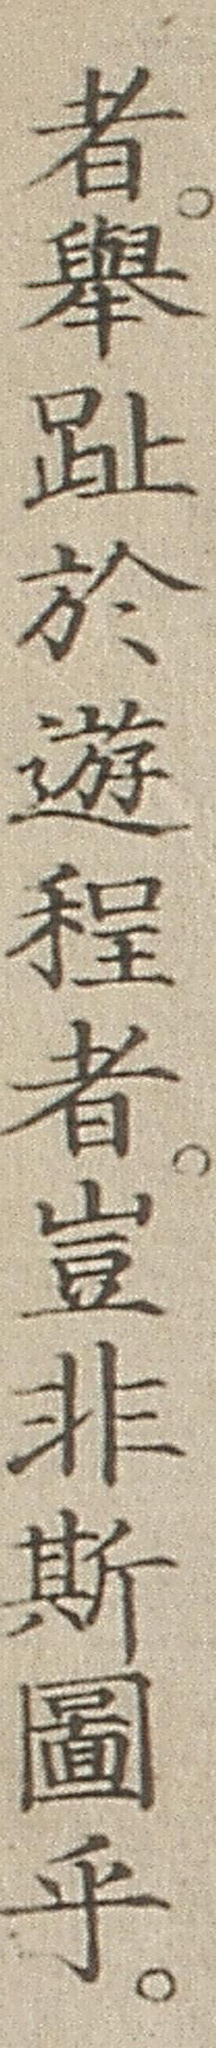者。挙趾於遊程者。豈非斯図乎。

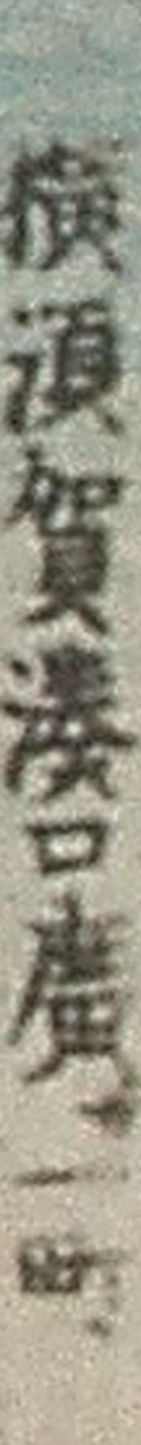横須賀湊口広サ一町
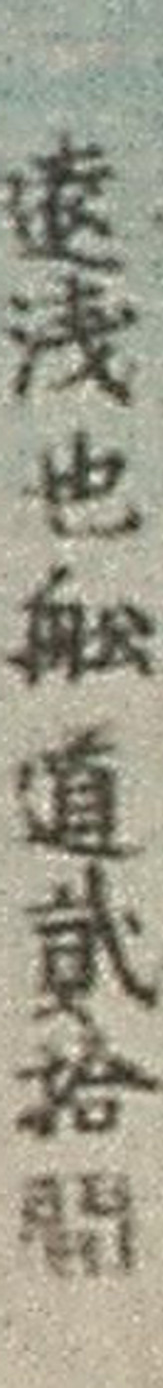遠浅也船道貳拾間
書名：冨士見十三州　輿地全圖
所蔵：東京大学地震研究所図書室 Earthquake Research Institute Library, The University of Tokyo, JAPAN
